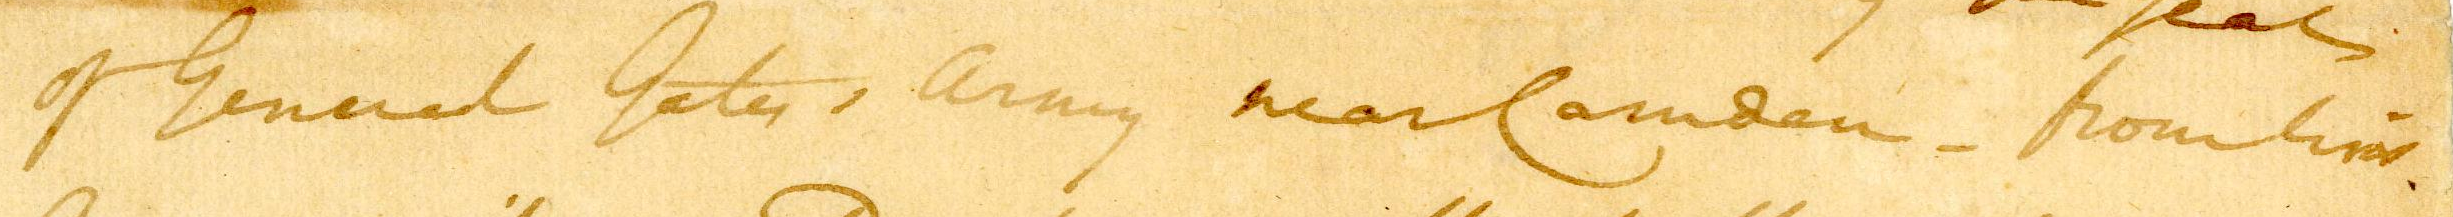of General Gates Army near Camden- from him
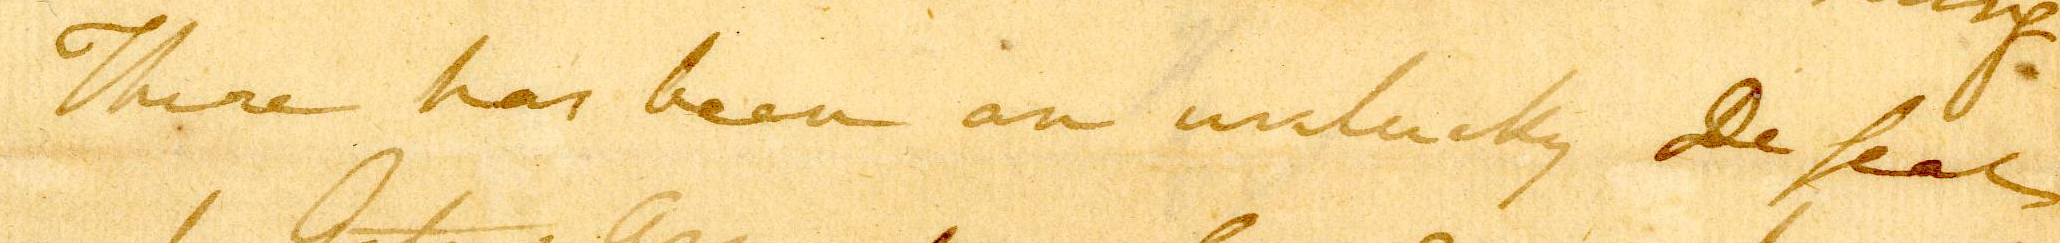There has been an unlucky Defeat
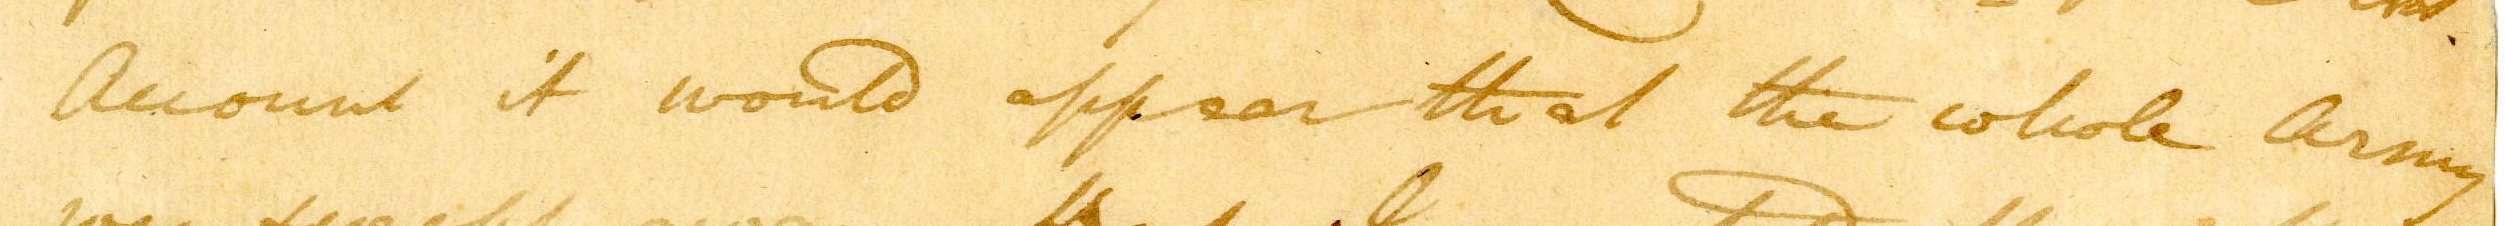Account it would appear that the whole Army
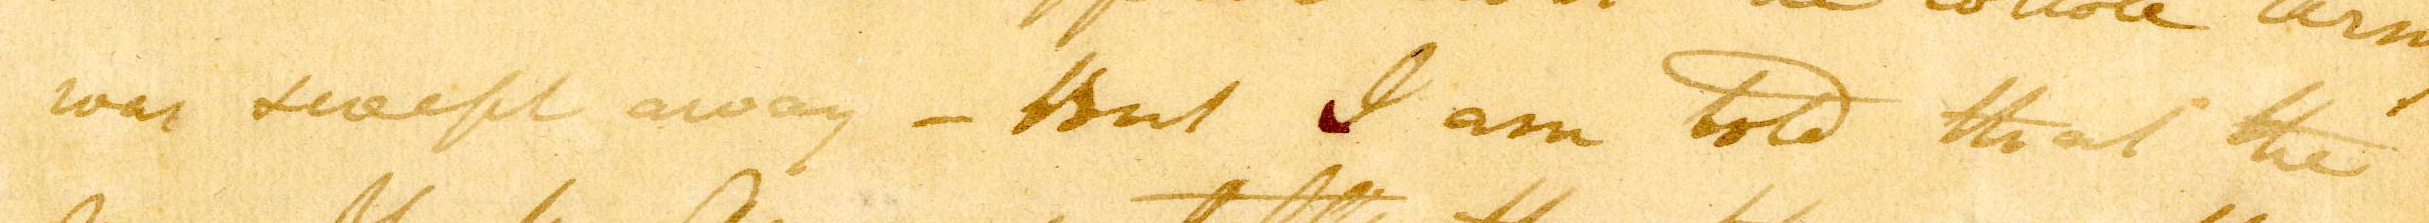was swept away- But I am told that the
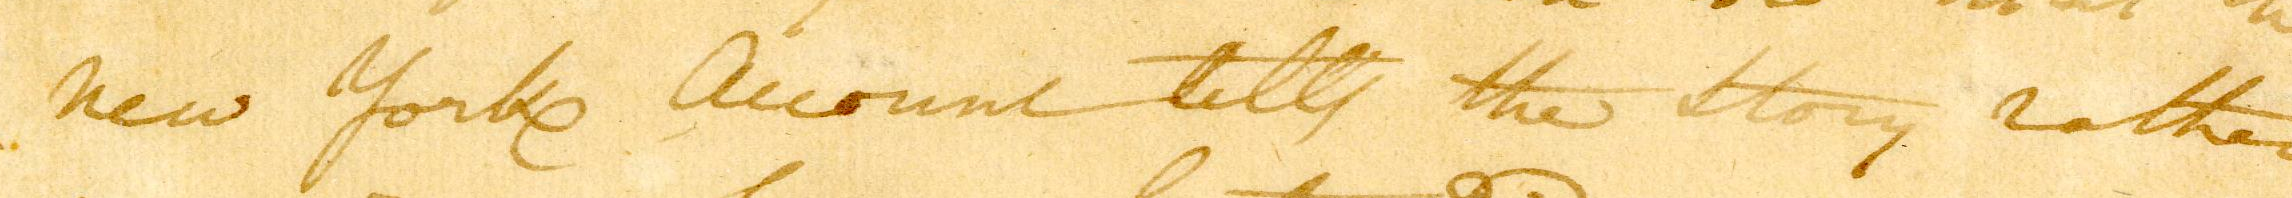New York Account tells the Story rather
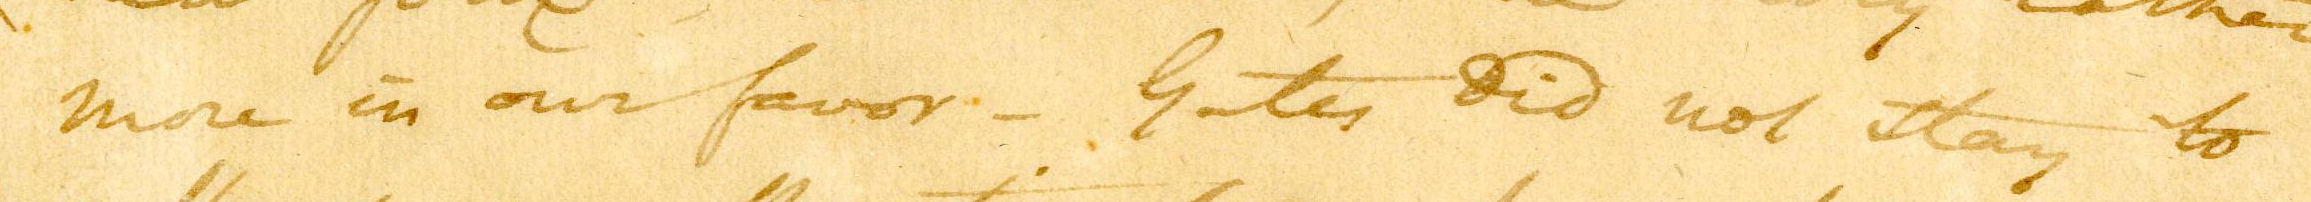more in our favor. Gates did not stay to
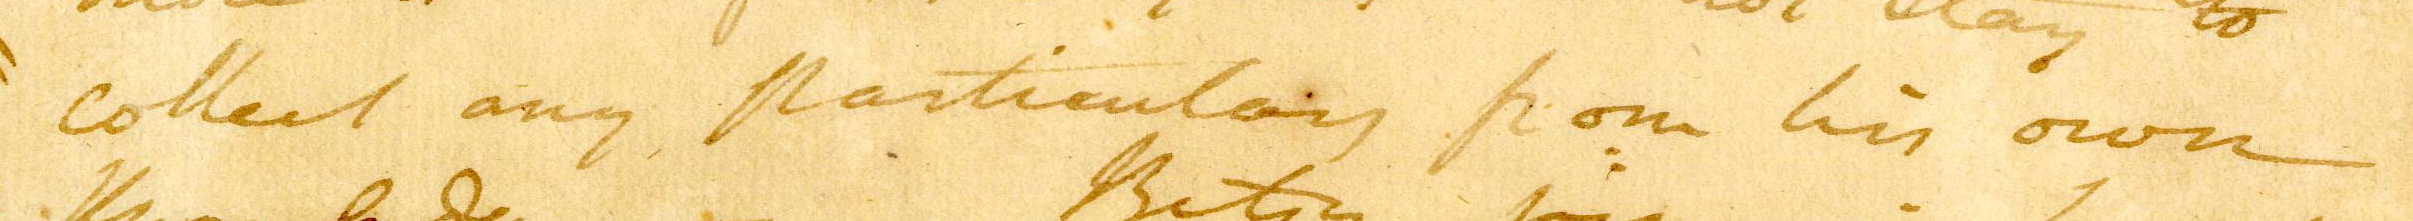collect any Particulars from his own
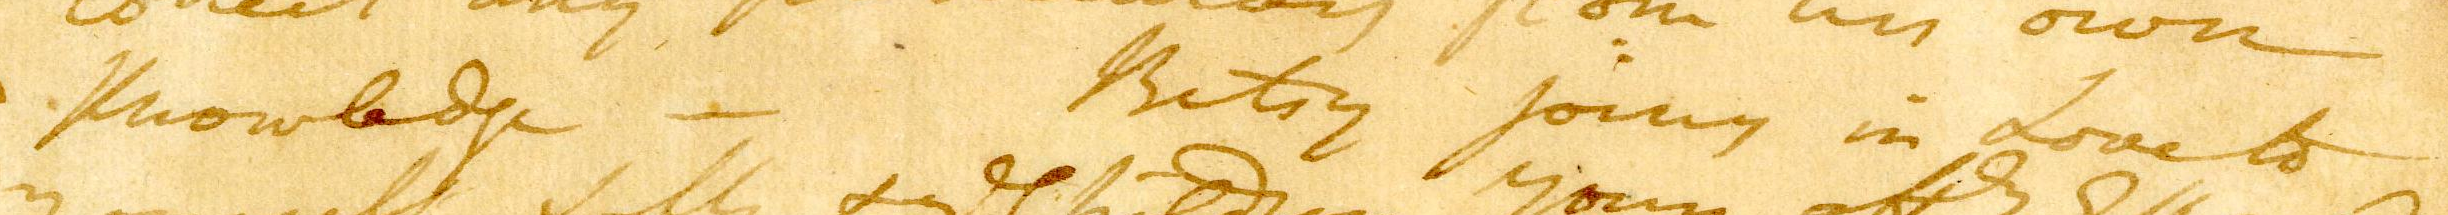knowledge. Betsy joins in Love to
